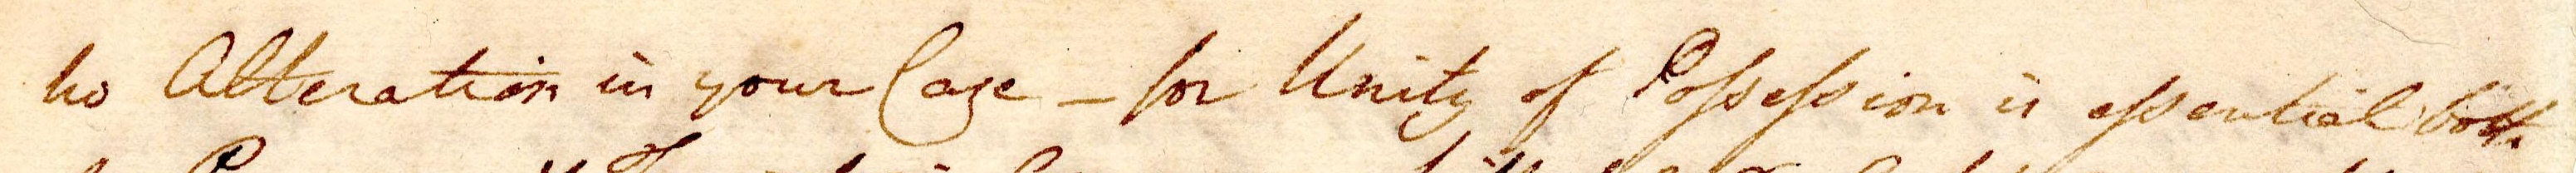no Alteration in your Case- for Unity of Possession is essential both
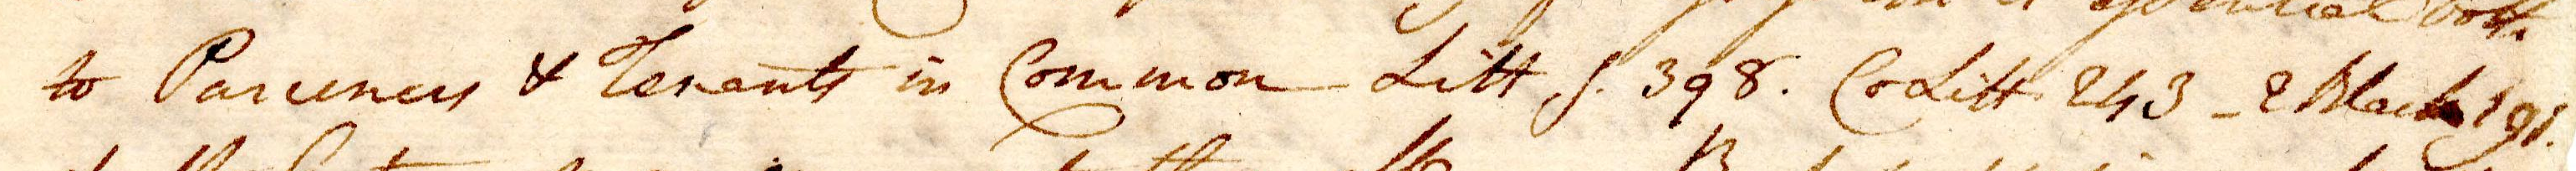to Parceners & Tenants in Common- Litt 398. Coditt 243- & Black 191
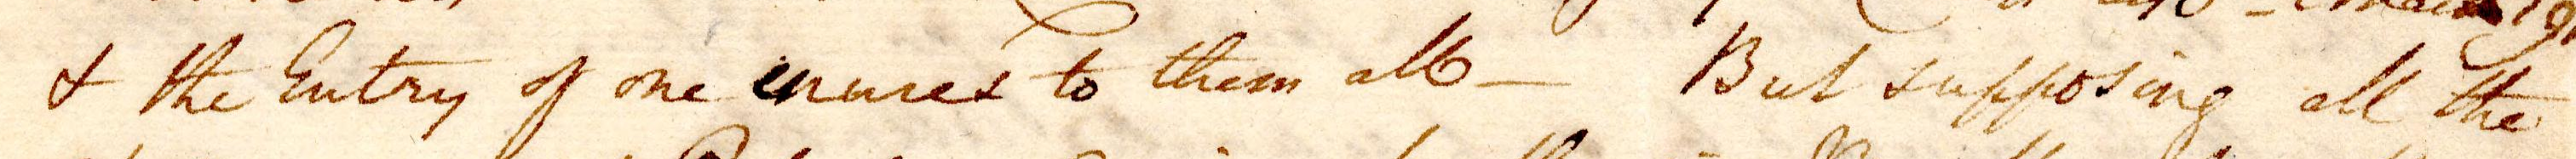& the Entry of one enaret to them all- But supposing all the
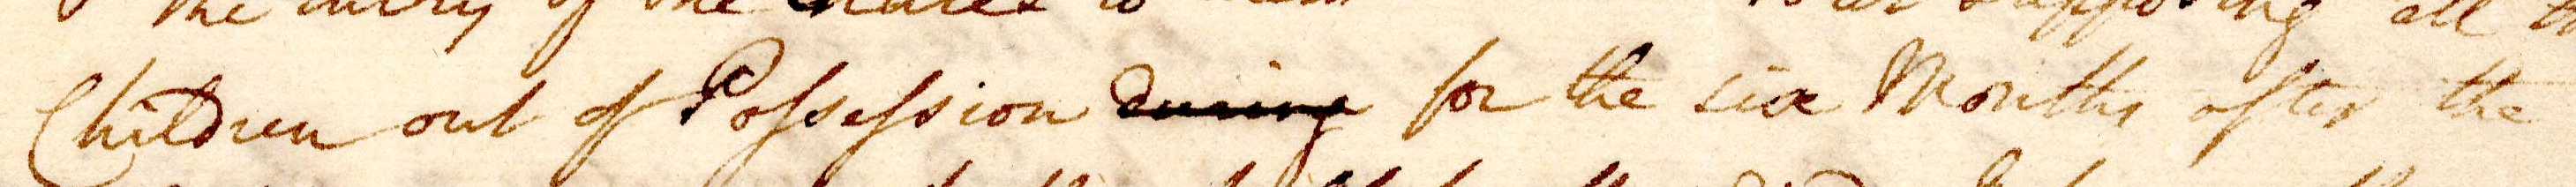Children out of Possession [during] for the six Months after the
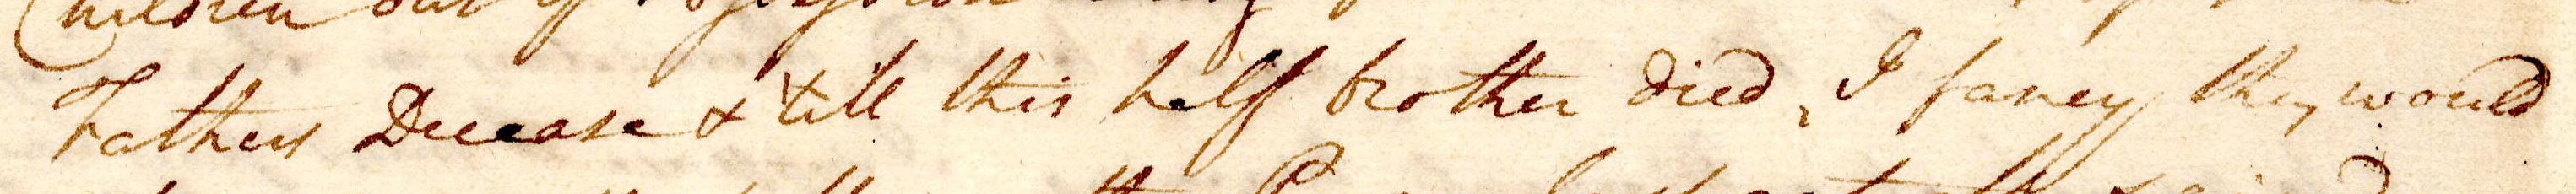Fathers Decease & 'till this half Brother died, I fancy they would
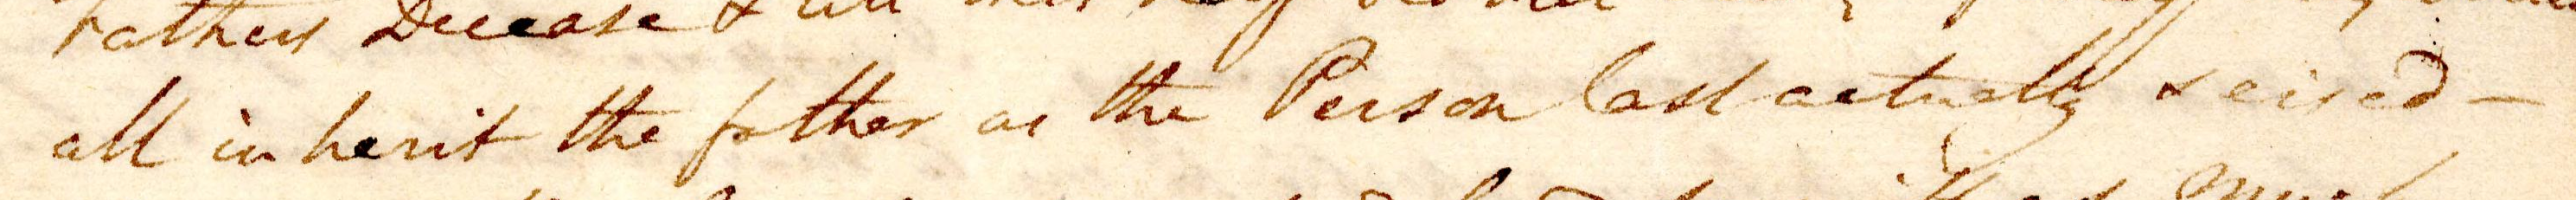all inherit the father as the Person Cast actually seised-
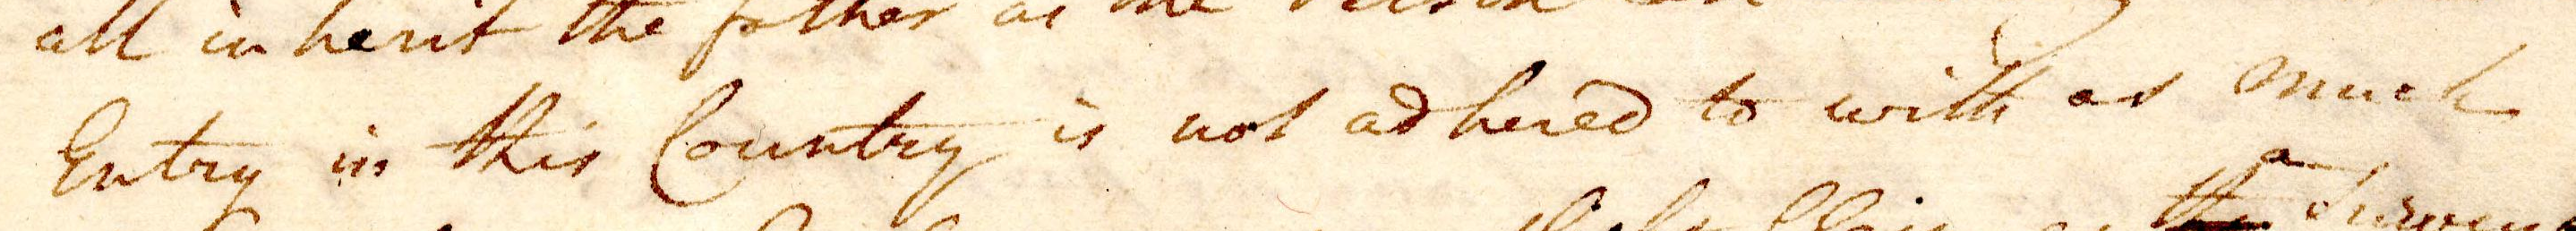Entry in this Country is not adhered to with as much
